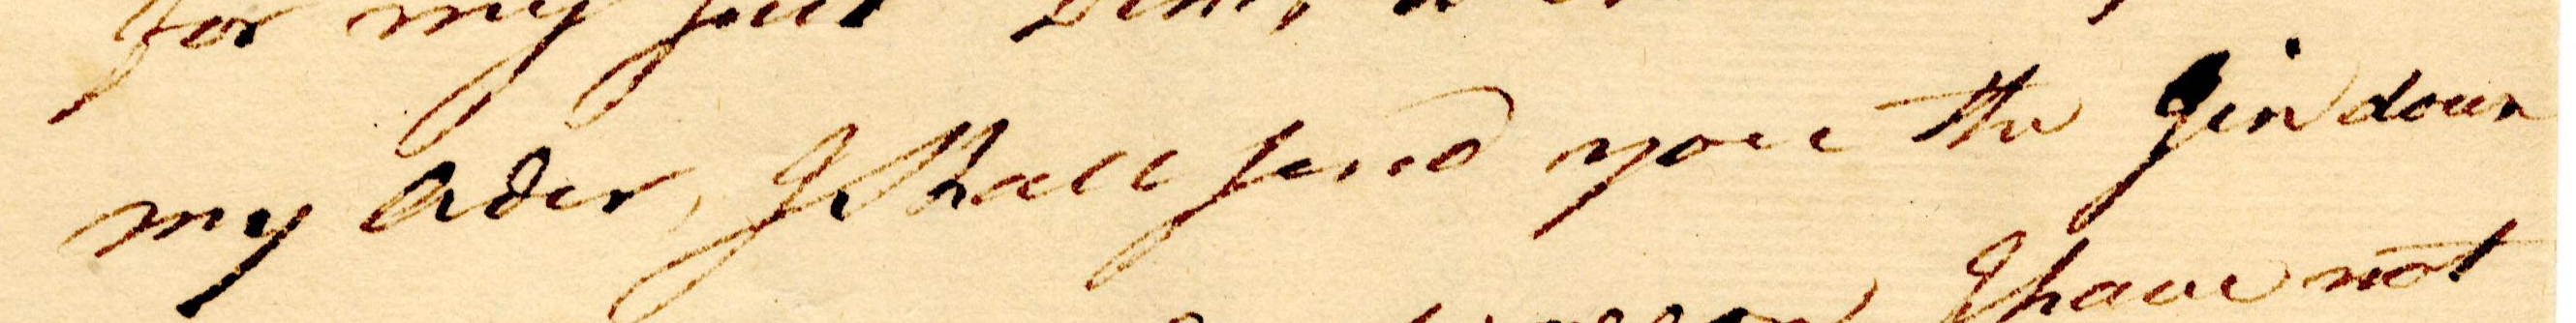my order, I shall send you the gin down
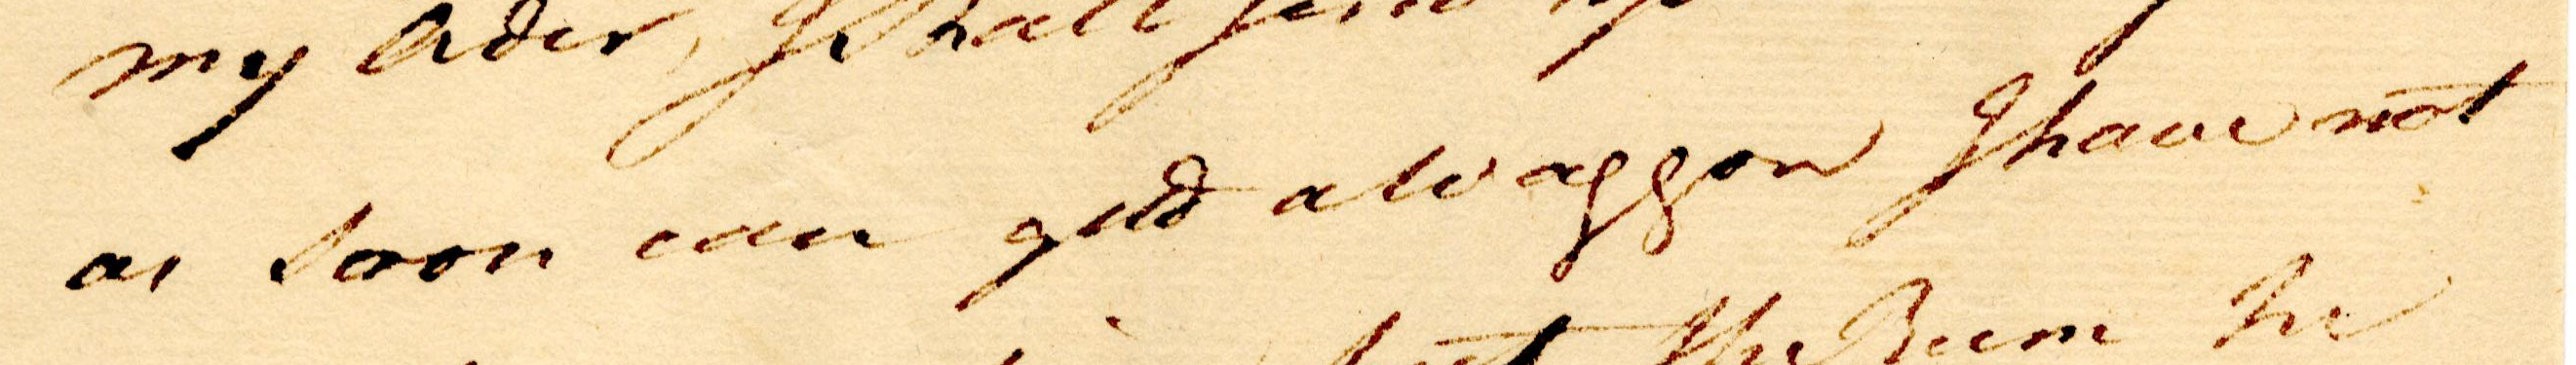as Soon can getd a waggon I have not
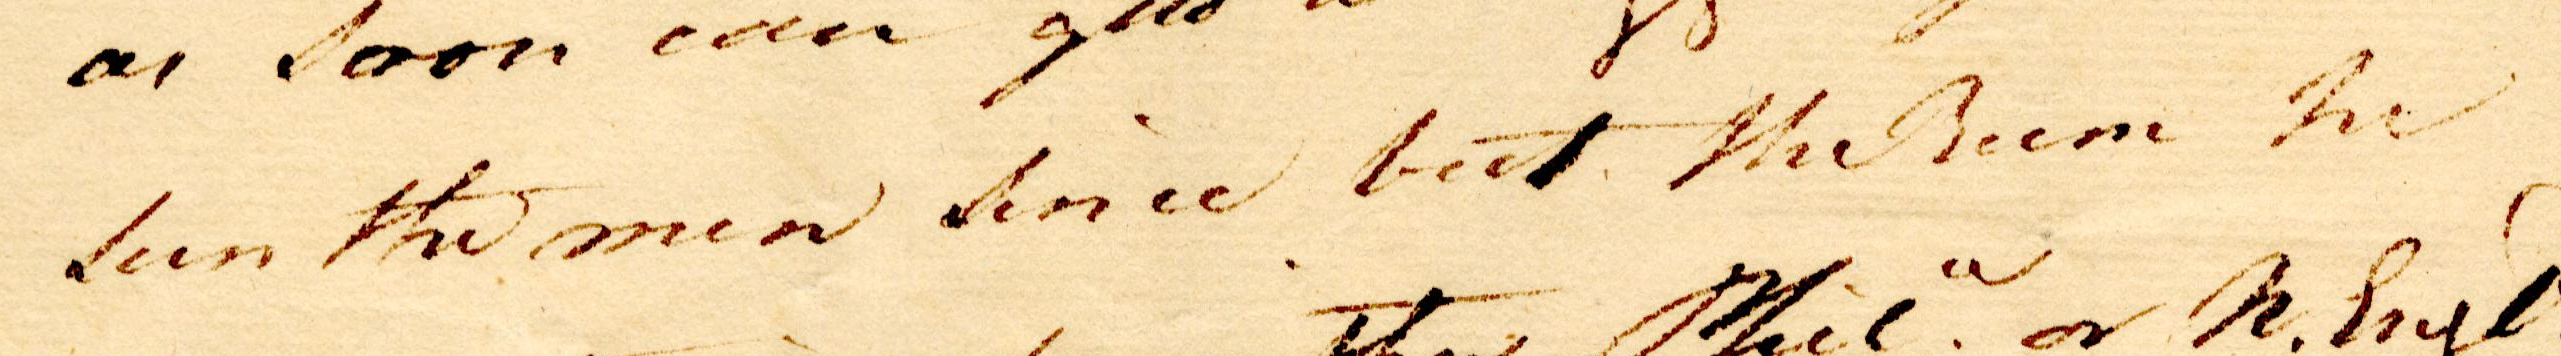seen the men since but the Rum he
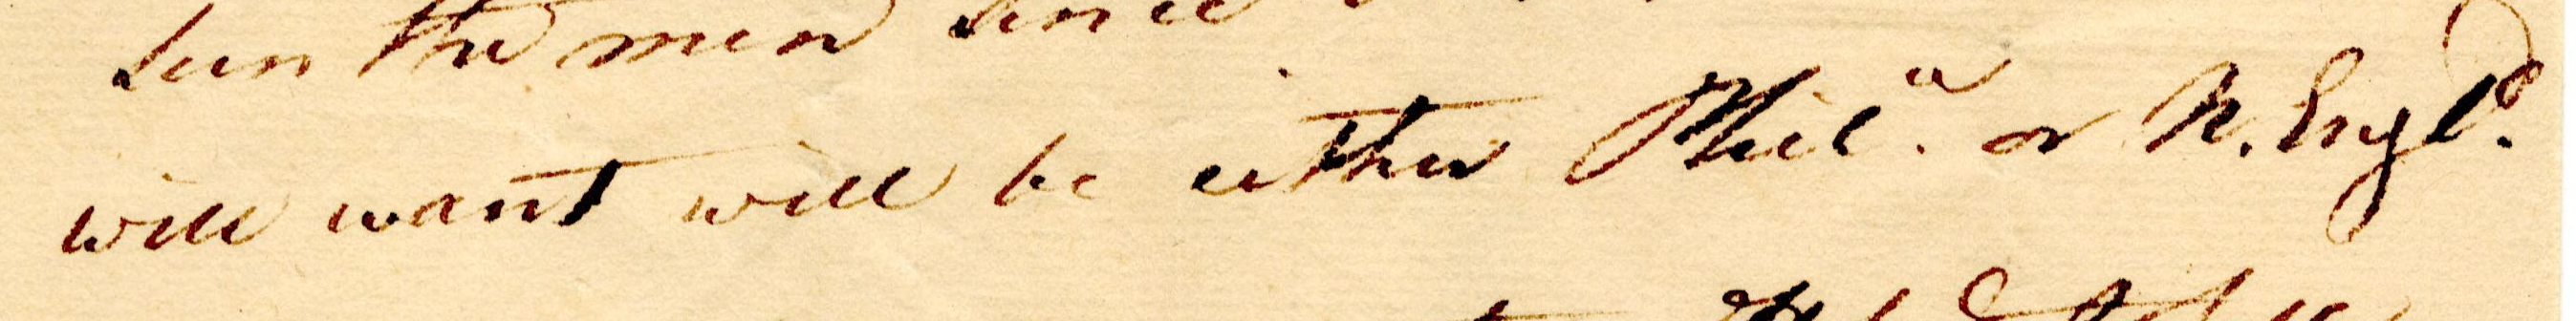will want will be either Phil^a. or N. Engl^d.
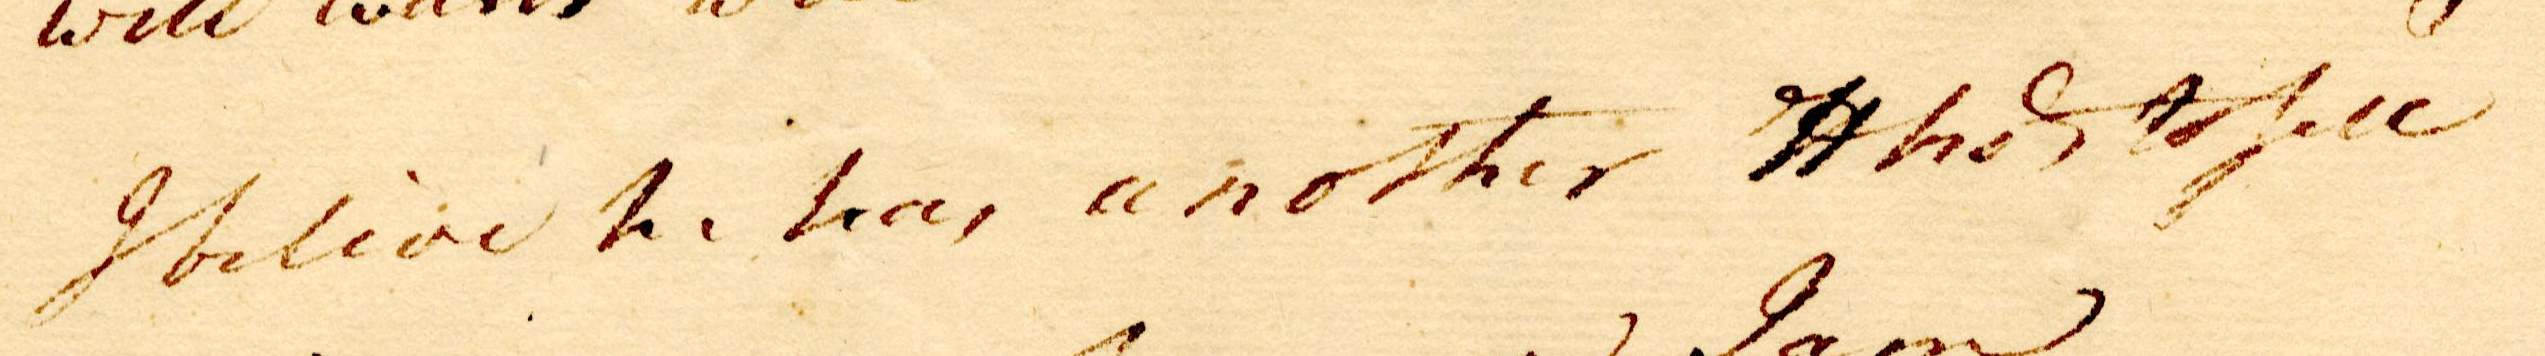I believe he has another Hhds to sell
